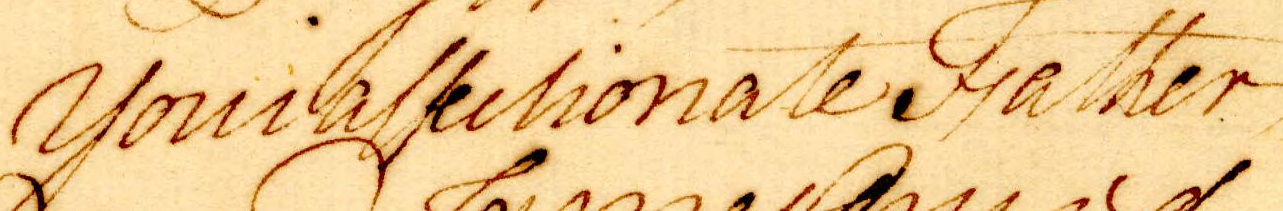Your affectionate Father
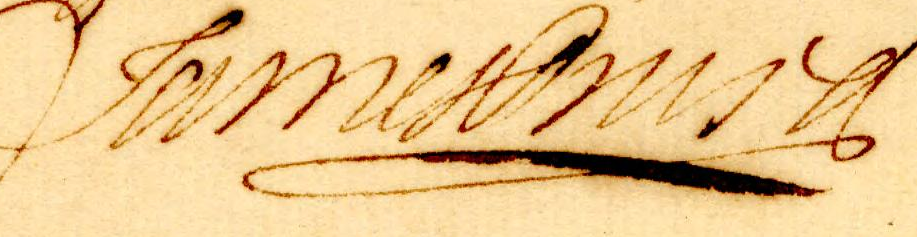James Burd
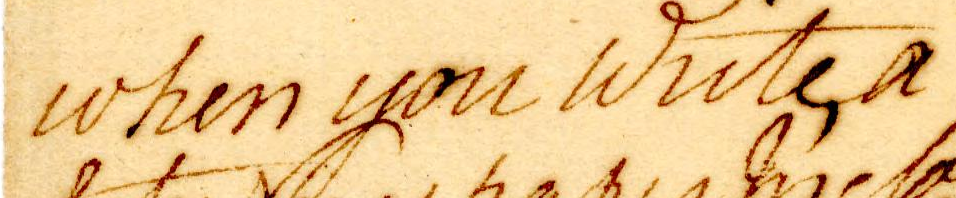when you write a
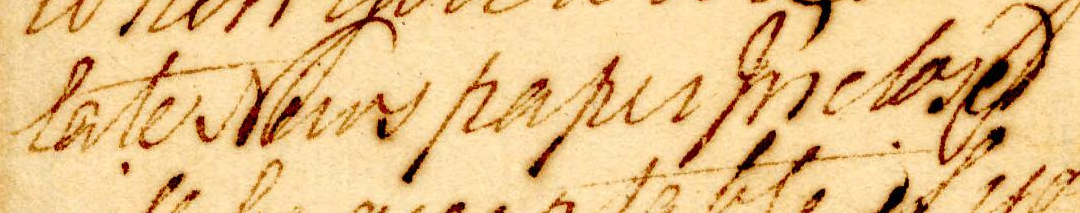later News paper Inclosed
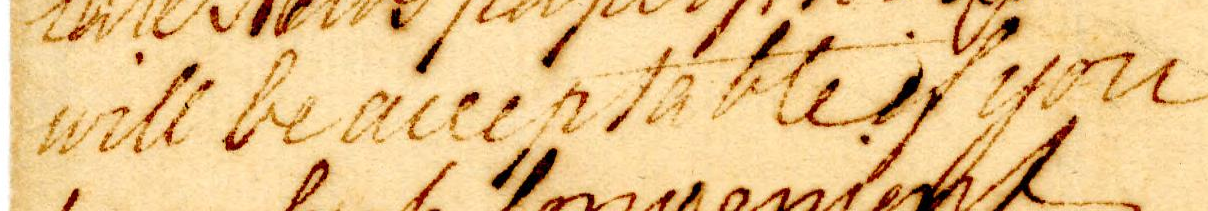will be acceptable of you
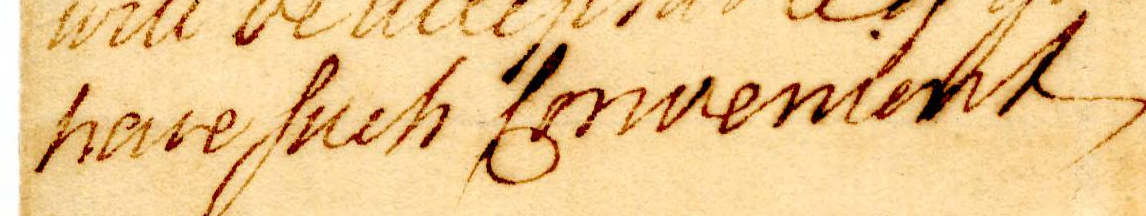have such Convenient
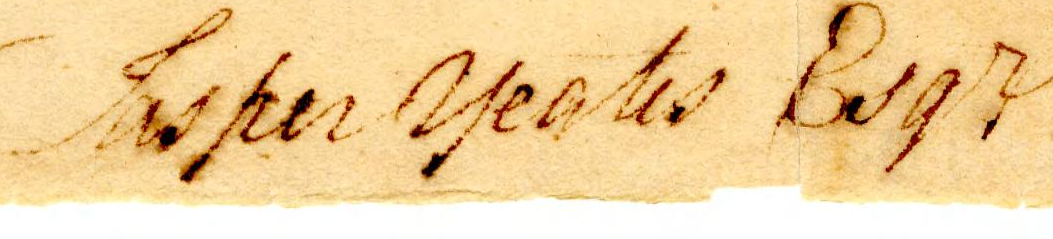Jasper Yeates Esq^r
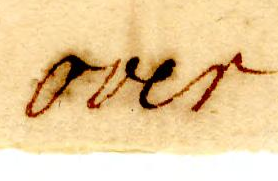over
